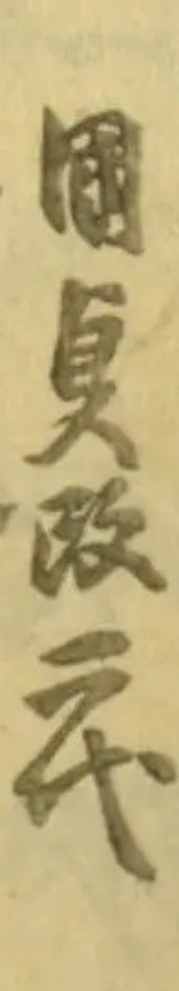国貞改二代
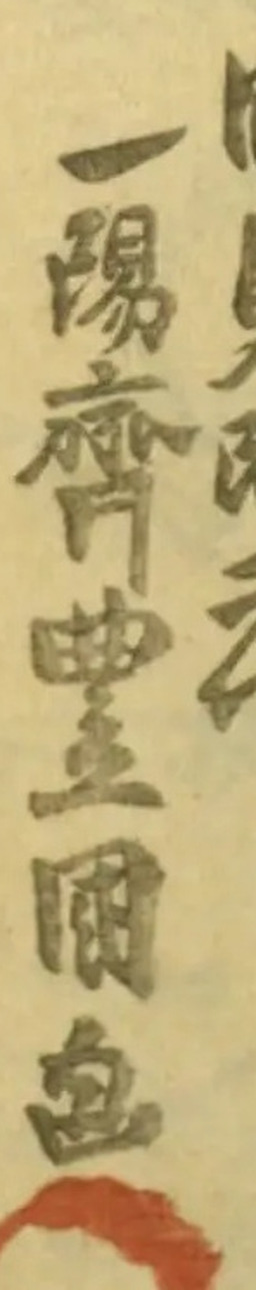一陽斎豊国画
